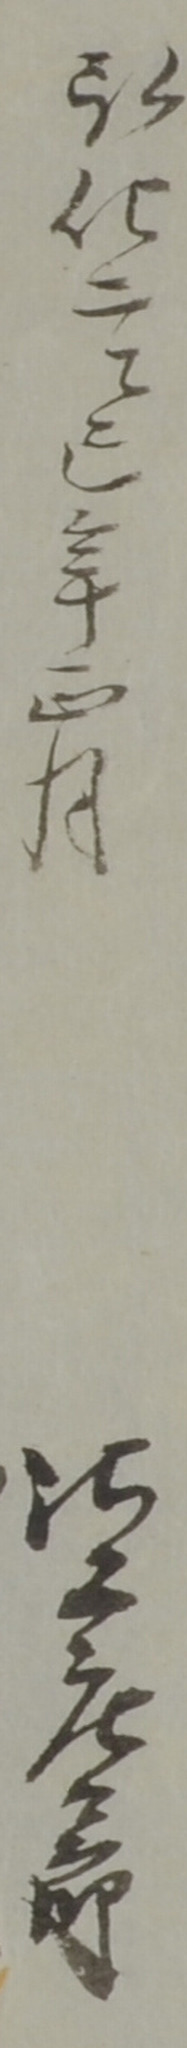弘化二乙巳年正月池上庄太郎
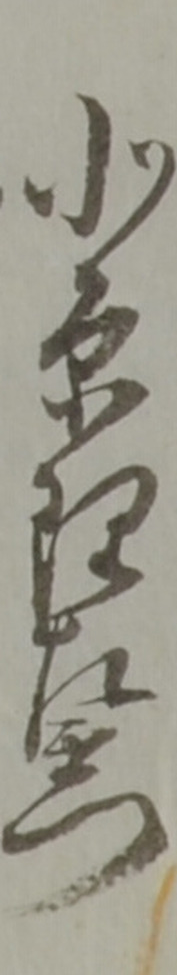北原理左衛門
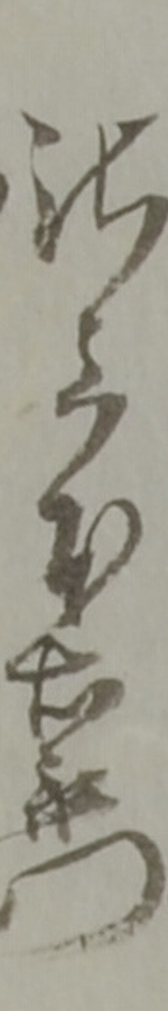池上本右衛門
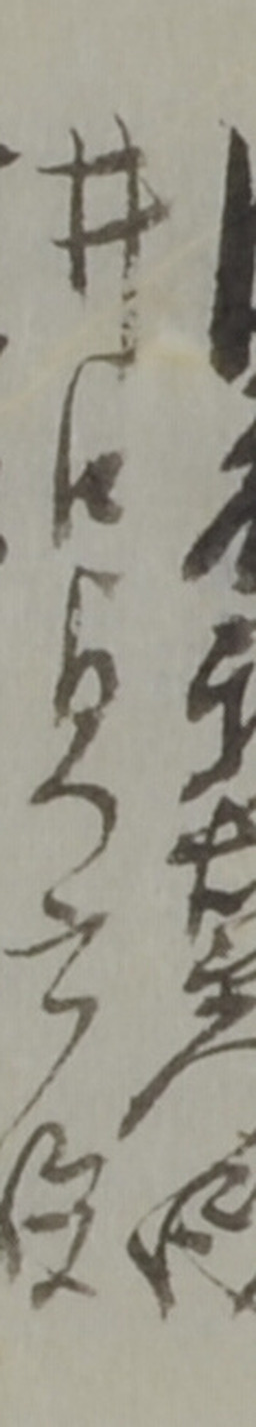井口貞六殿
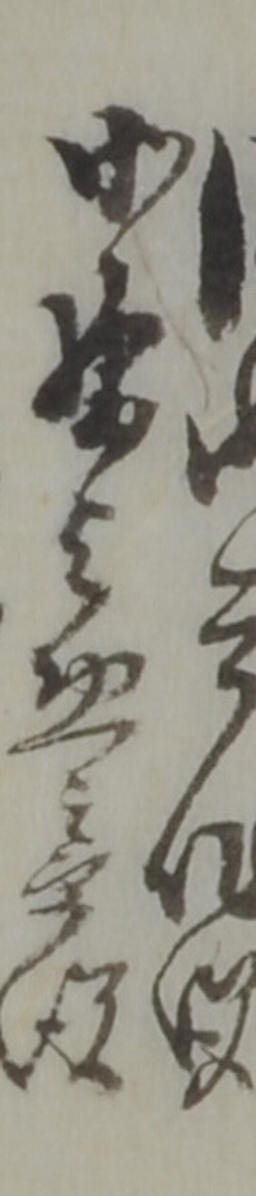北野与惣兵衛殿
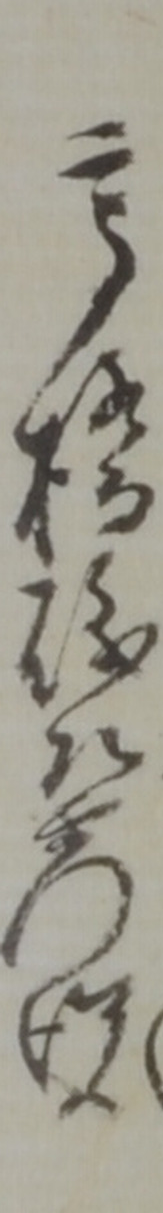高橋孫左衛門殿
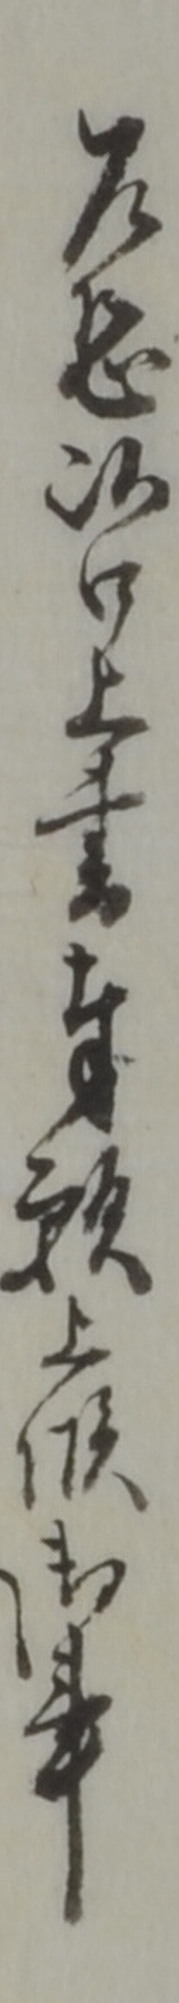乍恐以口上書奉願上候御事
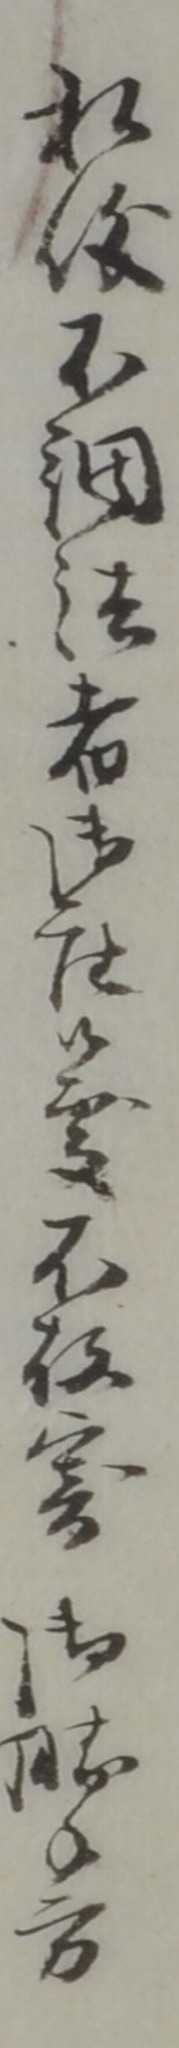私儀不調法者御座候處不存寄御勝手方
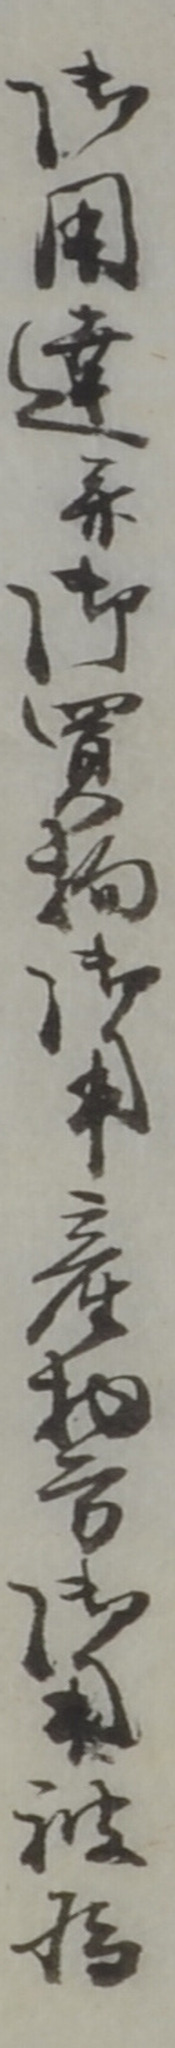御用達幷御買物御用産物方御用被為
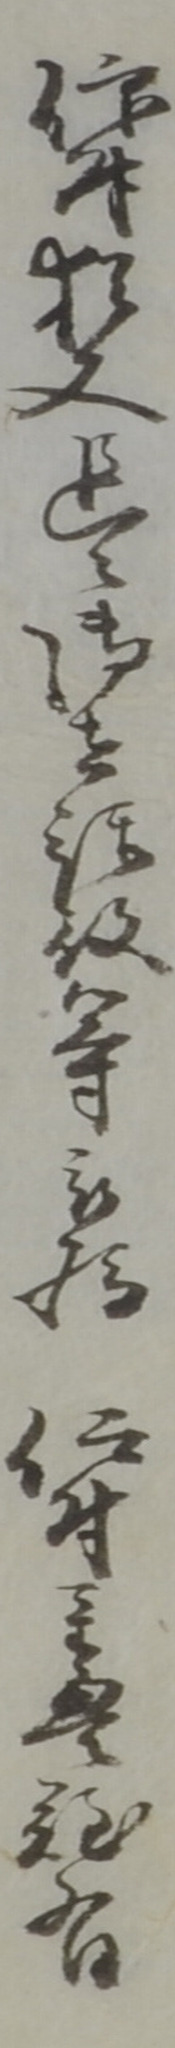仰付猶又追々御世話役等被為仰付重畳難有
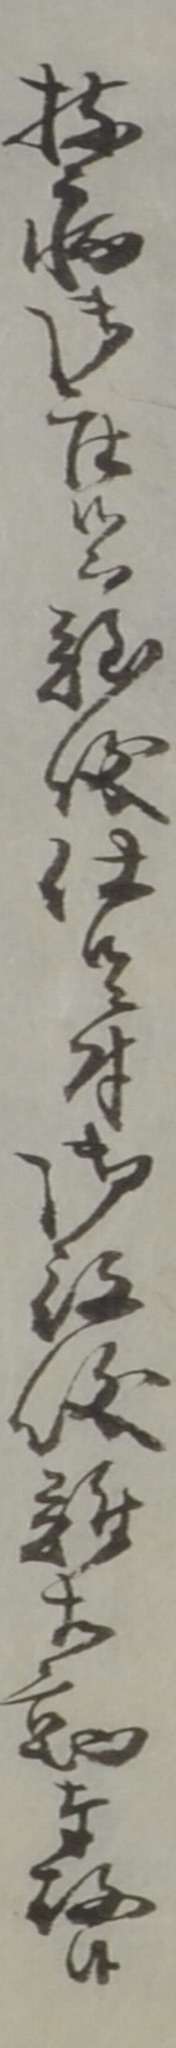持病御座候而難儀仕候ニ付御役儀難相勤奉存候
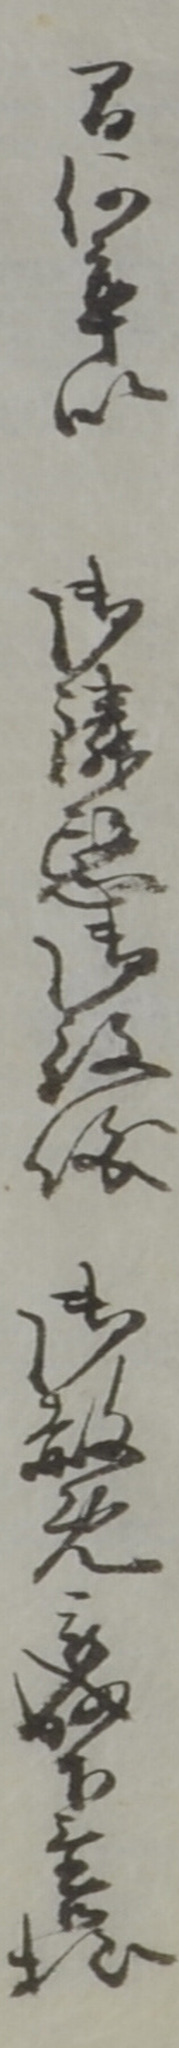間何卒以御憐愍御役儀御赦免被成下置候様
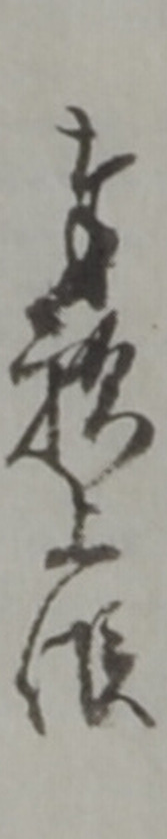奉願上候
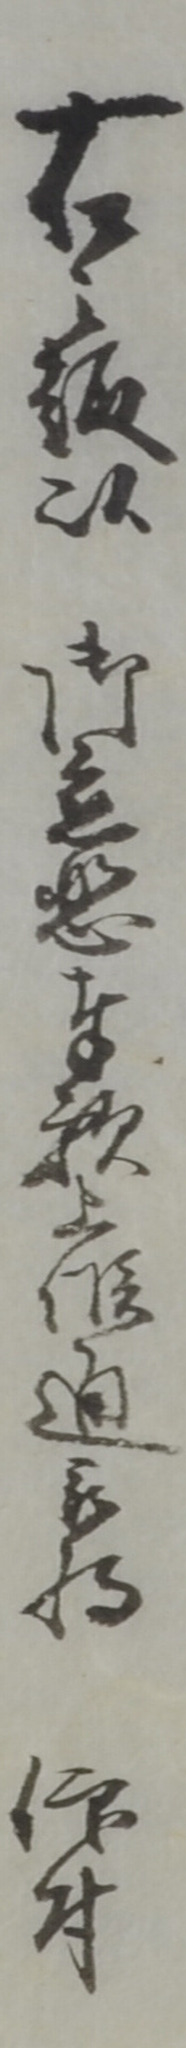右之趣以御慈悲奉願上候通被為仰付
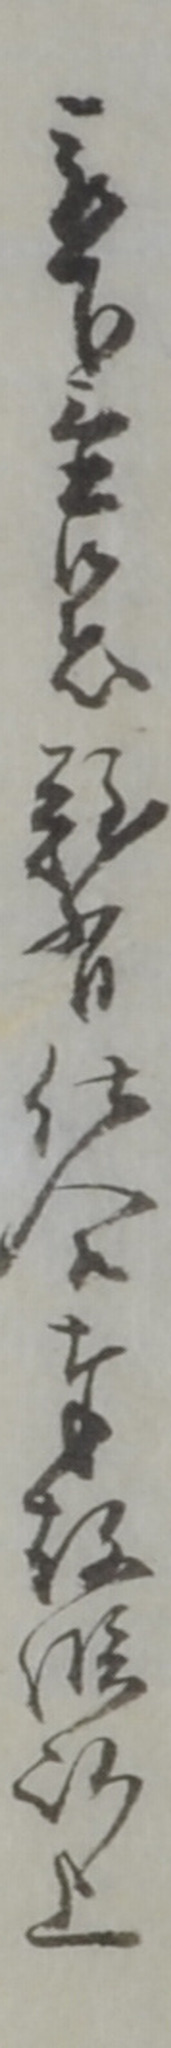被下置候者難有仕合奉存候以上

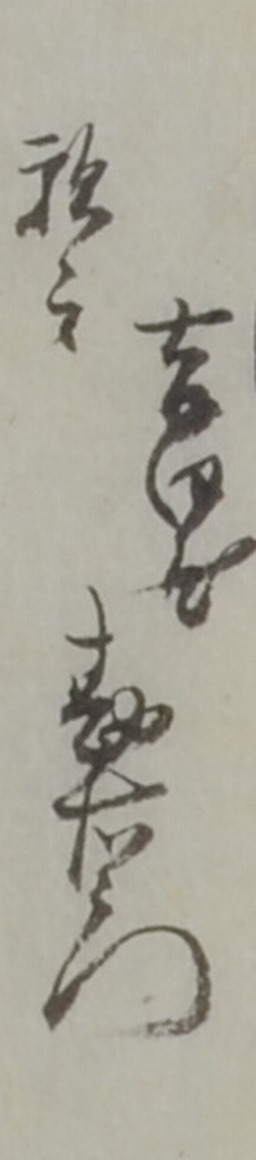願主勘右衛門
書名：諸願書控簿
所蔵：伊那市立高遠町図書館・合同会社AMANE
